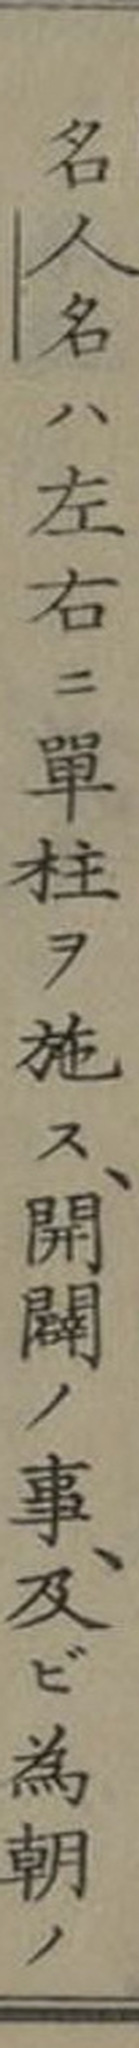名人名ハ左右ニ単柱ヲ施ス、開闢ノ事、及ビ為朝ノ
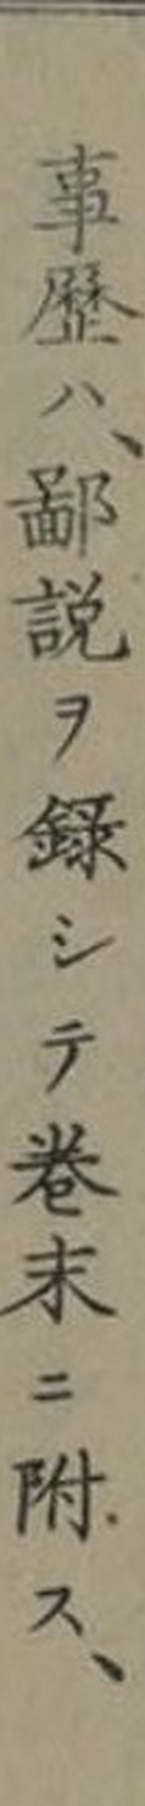事歴ハ、鄙説ヲ録シテ巻末ニ附ス、
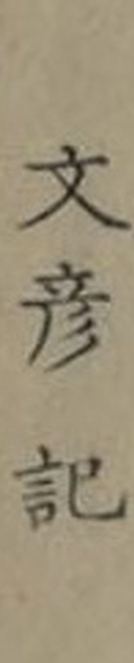文彦記

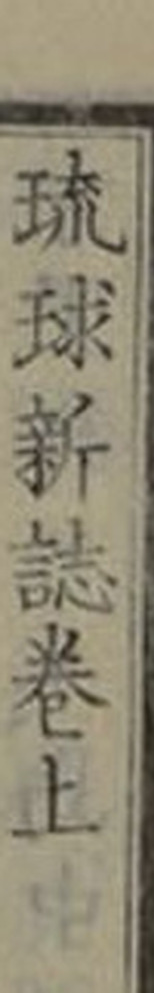琉球新誌巻上
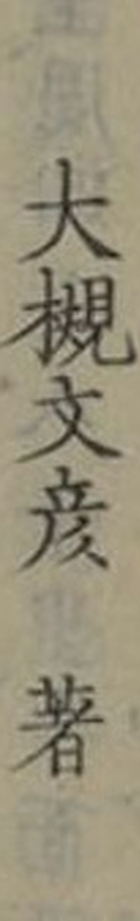大槻文彦著
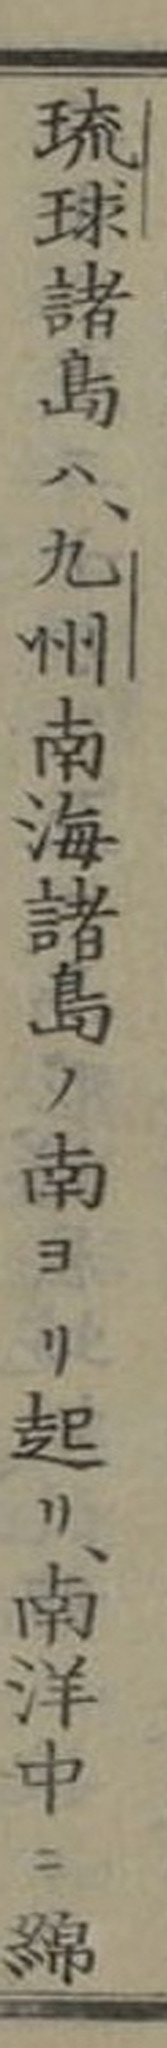琉球諸島ハ、九州南海諸島ノ南ヨリ起リ、南洋中ニ綿
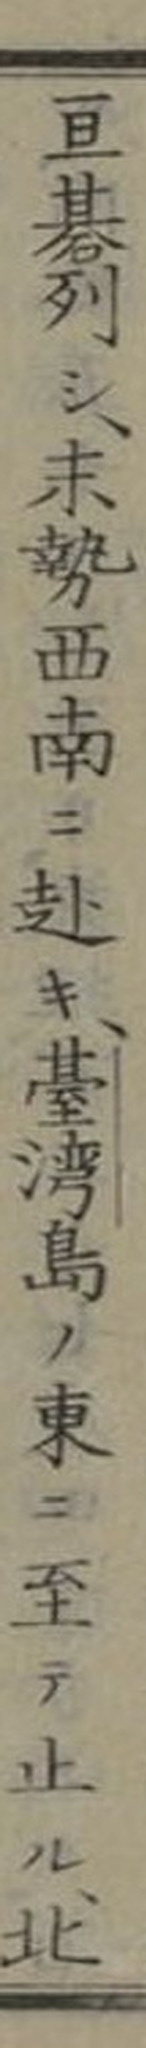亘碁列シ、末勢西南ニ赴キ、台湾島ノ東ニ至テ止ル、北
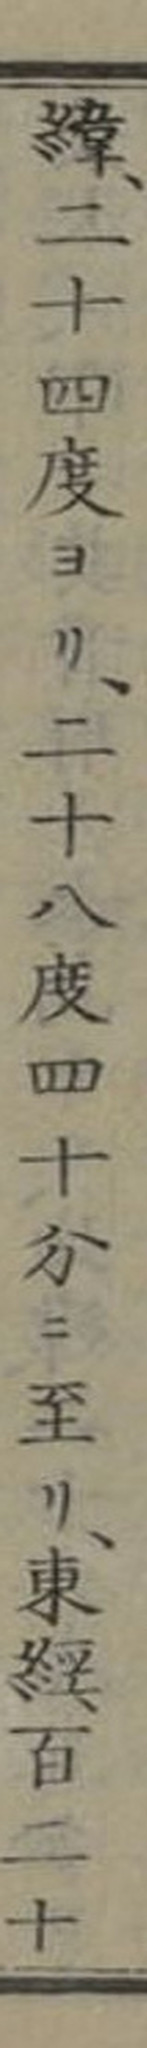緯、二十四度ヨリ、二十八度四十分ニ至リ、東経、百二十
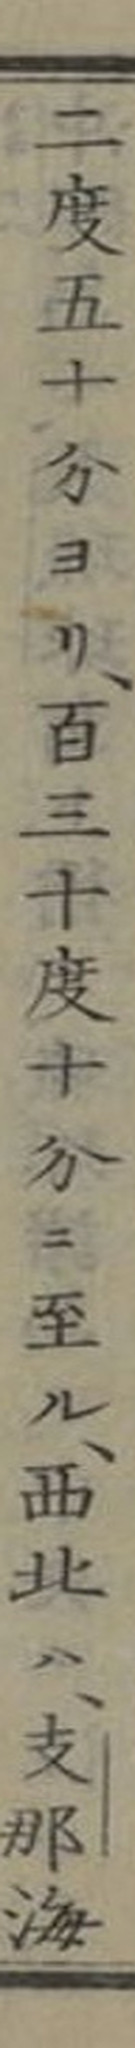二度五十分ヨリ、百三十度十分ニ至ル、西北ハ、支那海
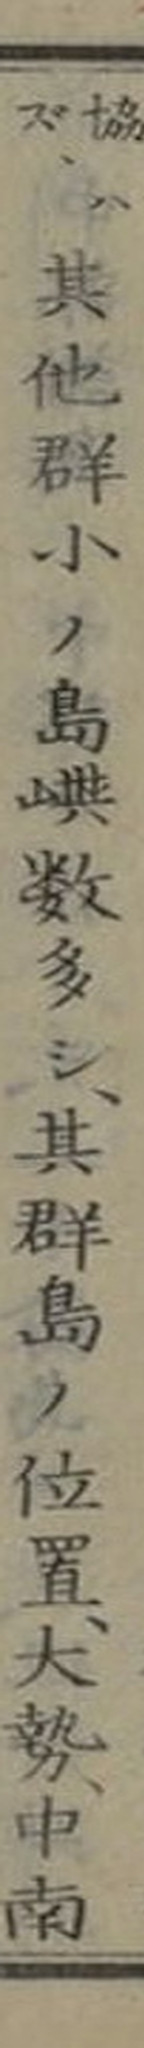協ハズ、其他群小ノ島嶼数多シ、其群島ノ位置、大勢、中南
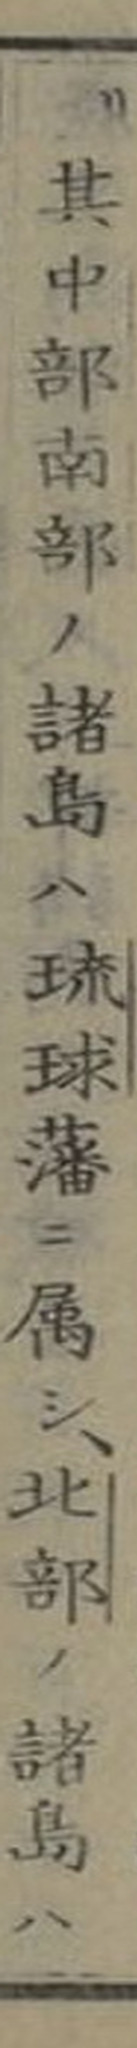リ其中部南部ノ諸島ハ琉球藩ニ属シ、北部ノ諸島ハ

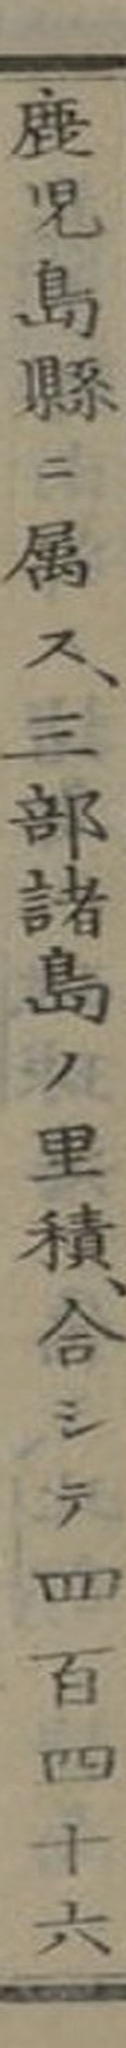鹿児島県ニ属ス、三部諸島ノ里積、合シテ四百四十六
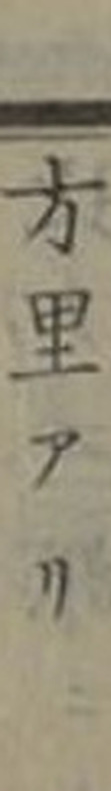方里アリ
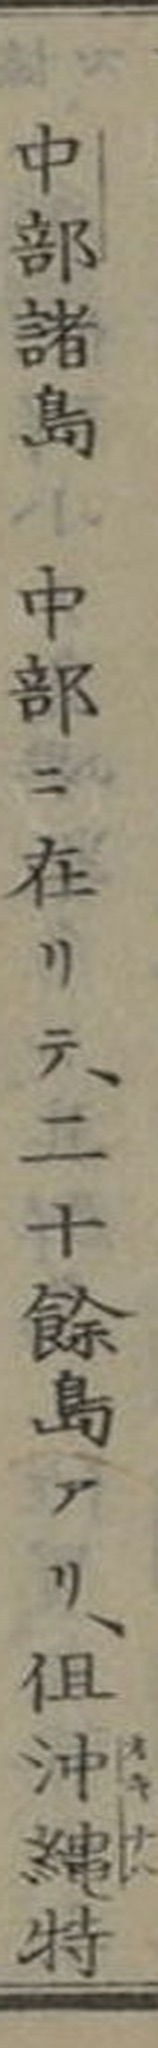中部諸島中部ニ在リテ、二十余島アリ、但沖縄特
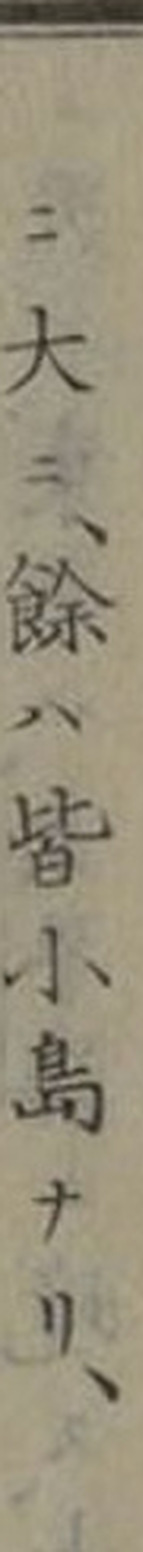ニ大ニ、余ハ皆小島ナリ、
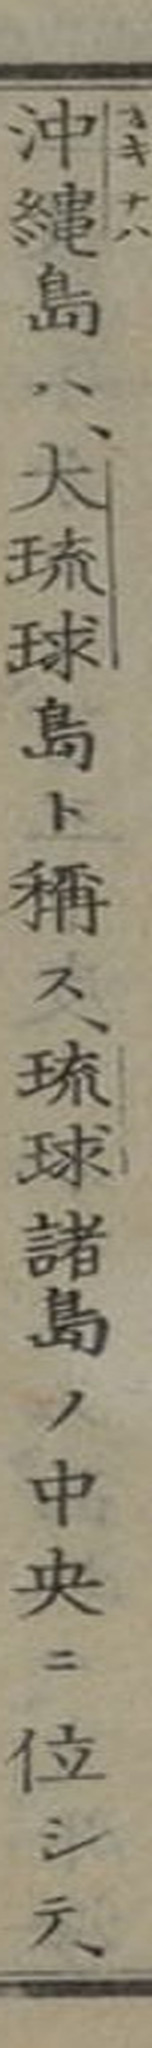沖縄島ハ、大琉球島ト称ス、琉球諸島ノ中央ニ位シテ、
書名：琉球新誌 図附 上
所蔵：University of the Ryukyus Library
